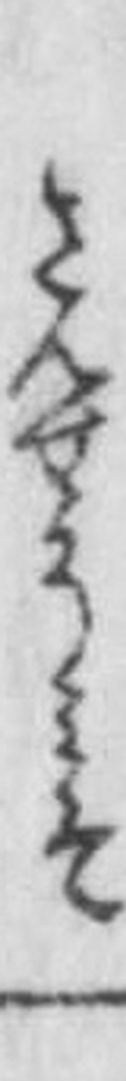さんせうミそ
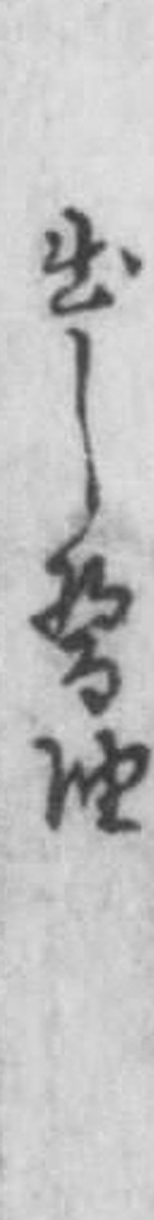出し醤油
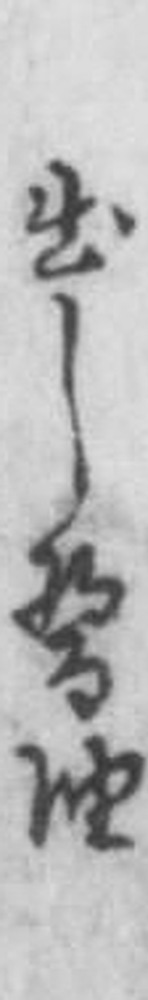出し醤油

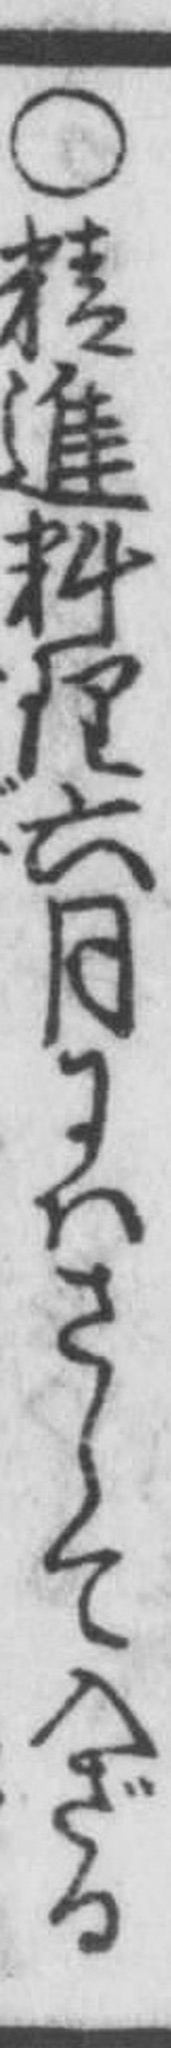〇精進料理六月にハさして入ざる
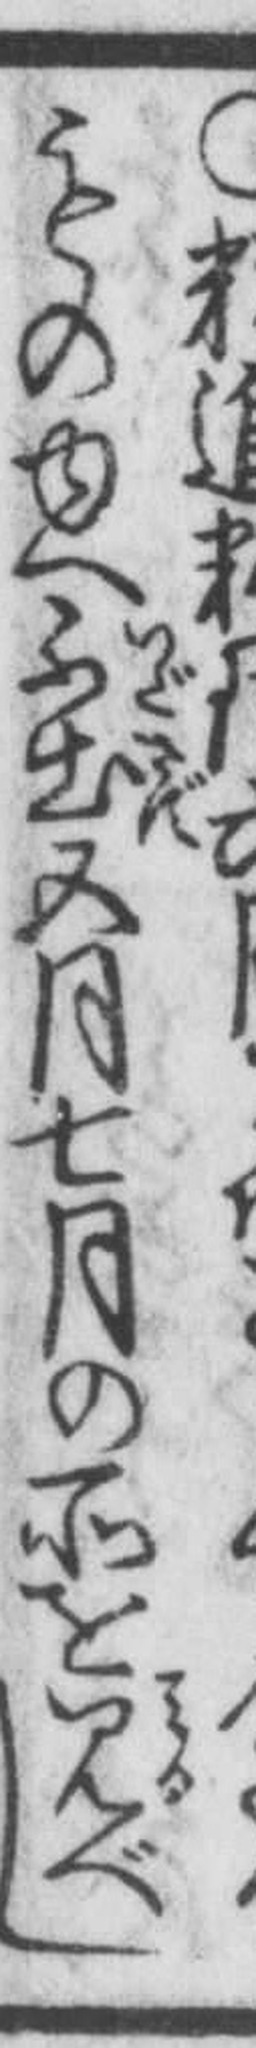そのゆへ不出五月七月所を見るべし
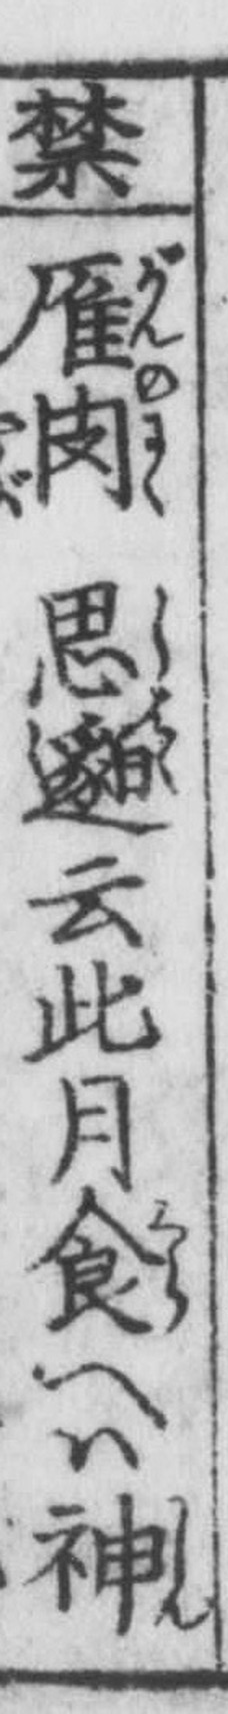禁雁肉思云此月此月食神
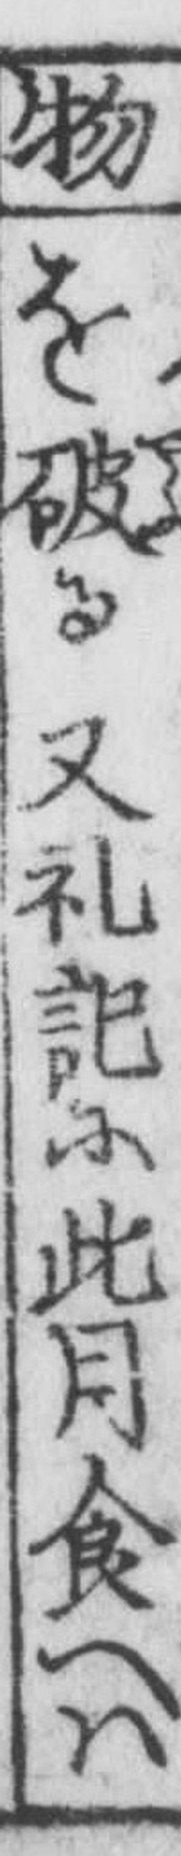物を破る又礼記に此月食へハ
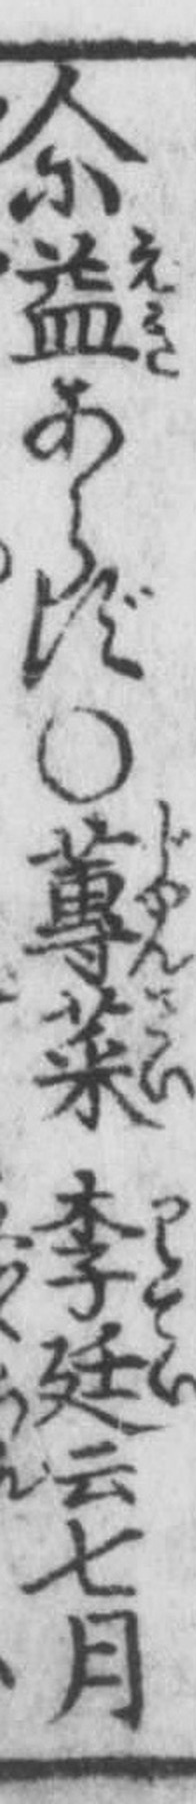人に益あらず丸〇蒪菜李廷云七月
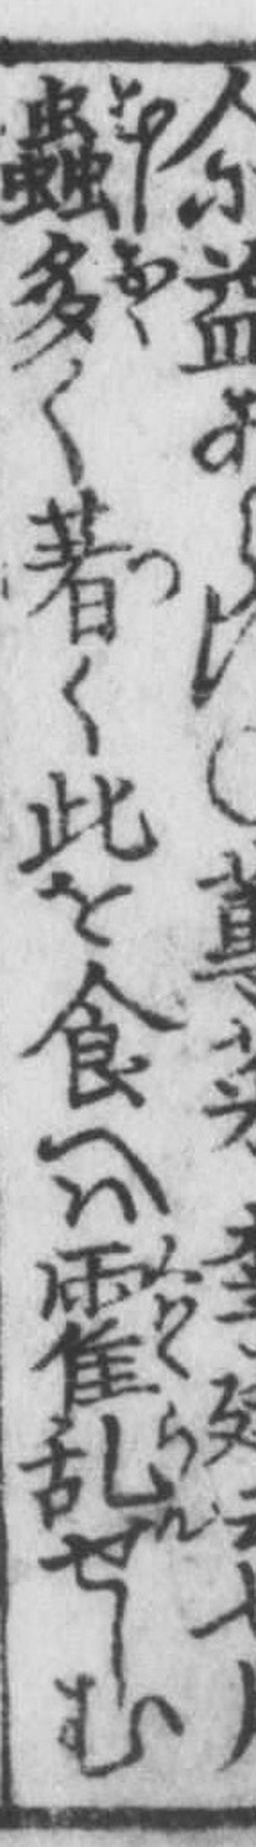蟲多く著く此を此月食へハ霍乱せしむ
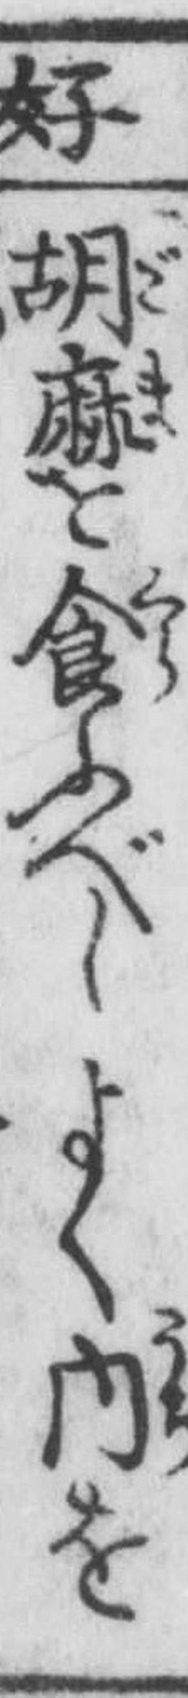好胡麻を食ふべしよく内を
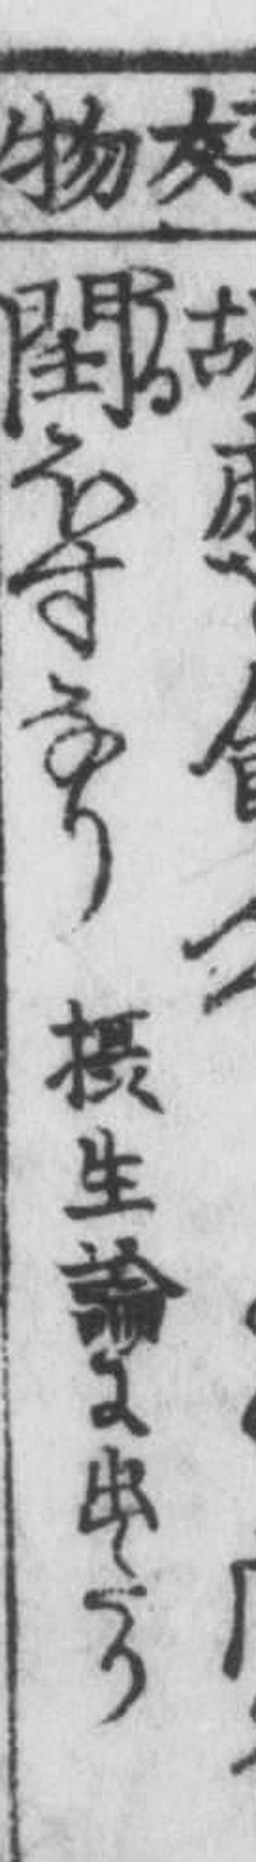物潤ほすなり摂生論に出たり
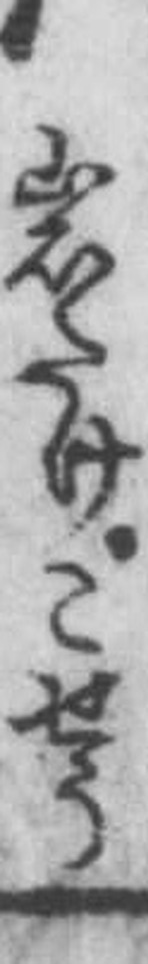清汁岩たけこせう
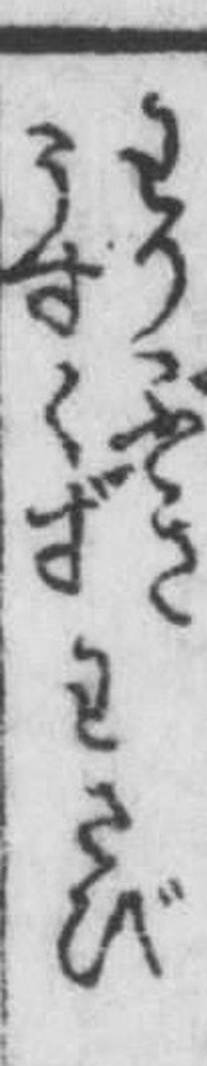うすくずわさび
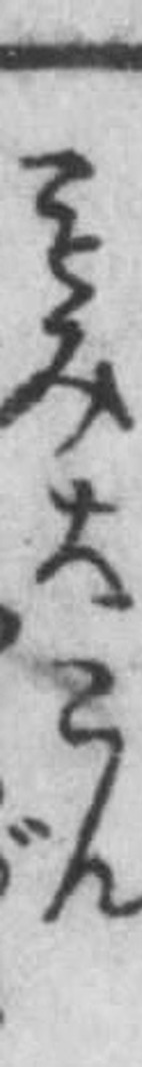もミ大こん

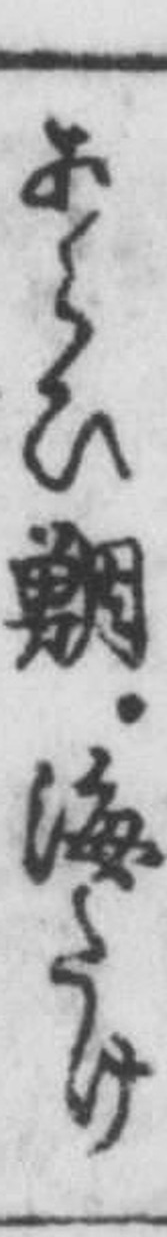あらひ鯛海たけ
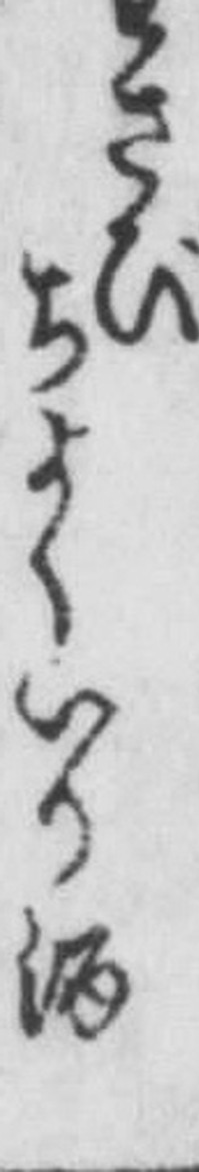ちよくいり酒
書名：当世料理筌
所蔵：大阪府立大学学術情報センター 国文学研究資料館
